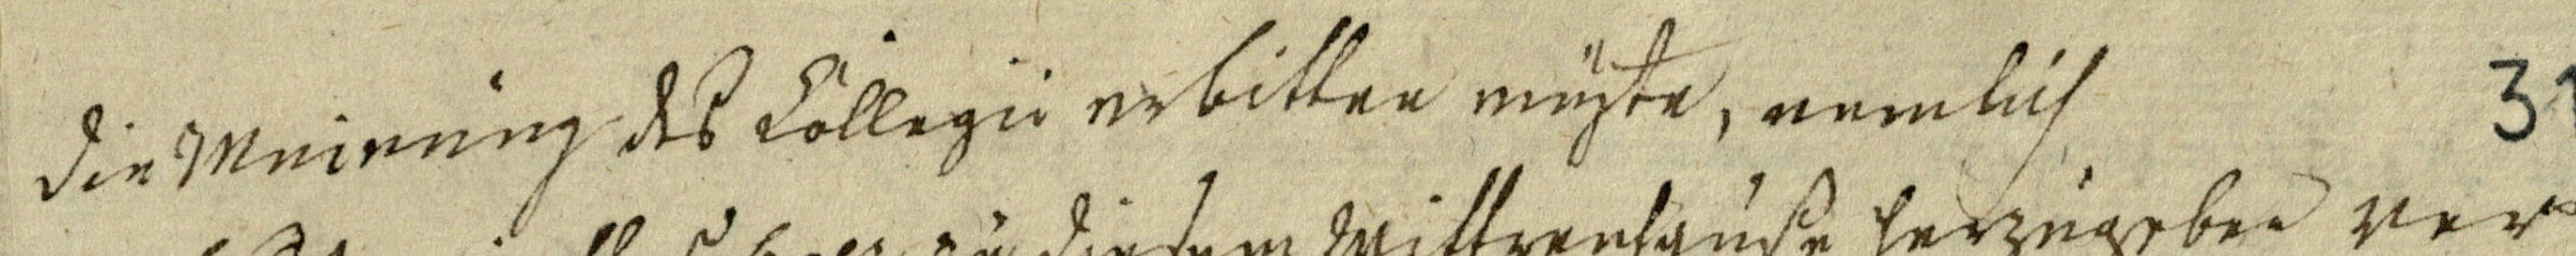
die Meinung des Collegii erbitten müste, nemlich
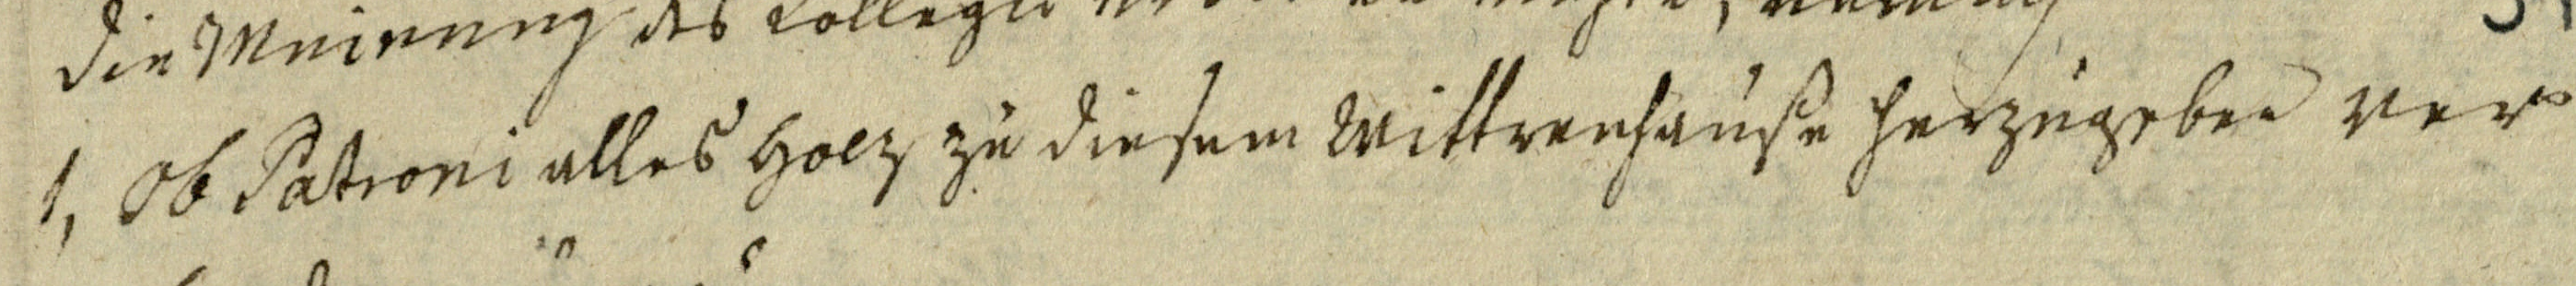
1. ob Patroni alles Holz zu diesem Wittwenhause herzugeben ver¬
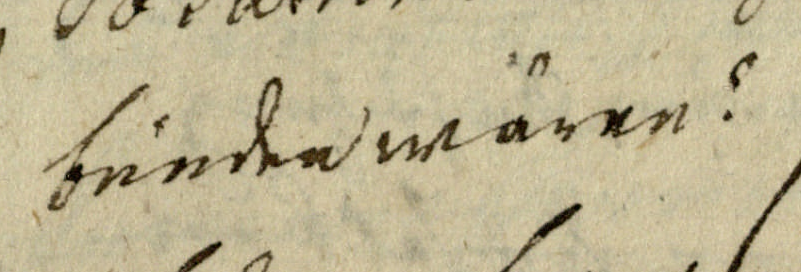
bunden wäre?
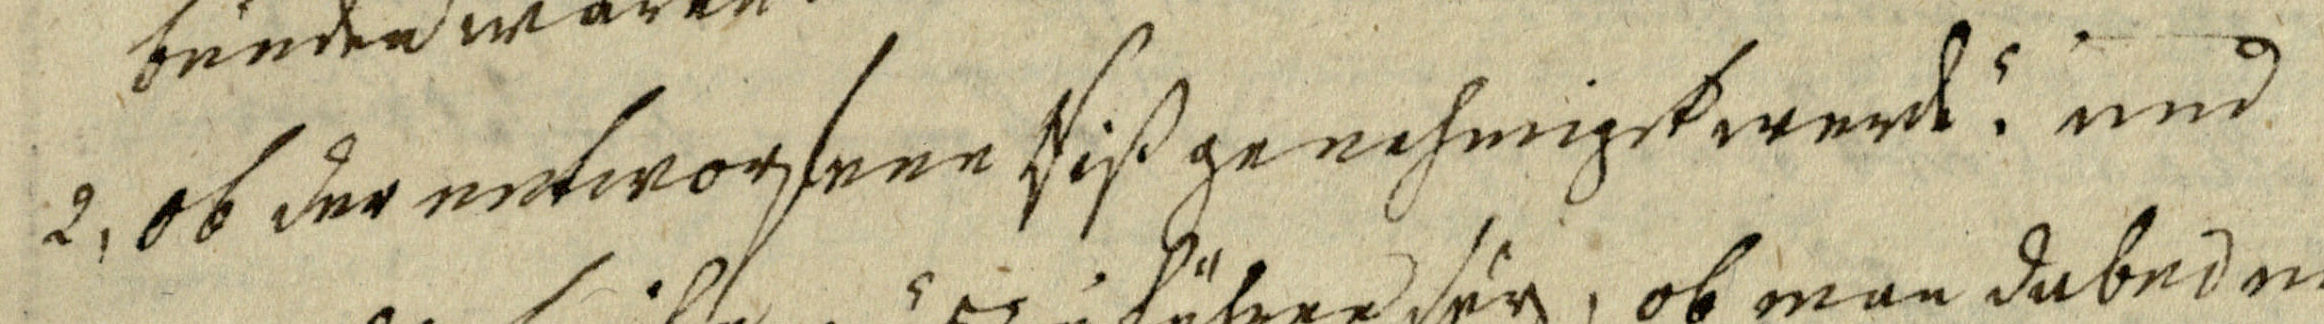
2, ob der entworfene Riß genehmiget werde? und
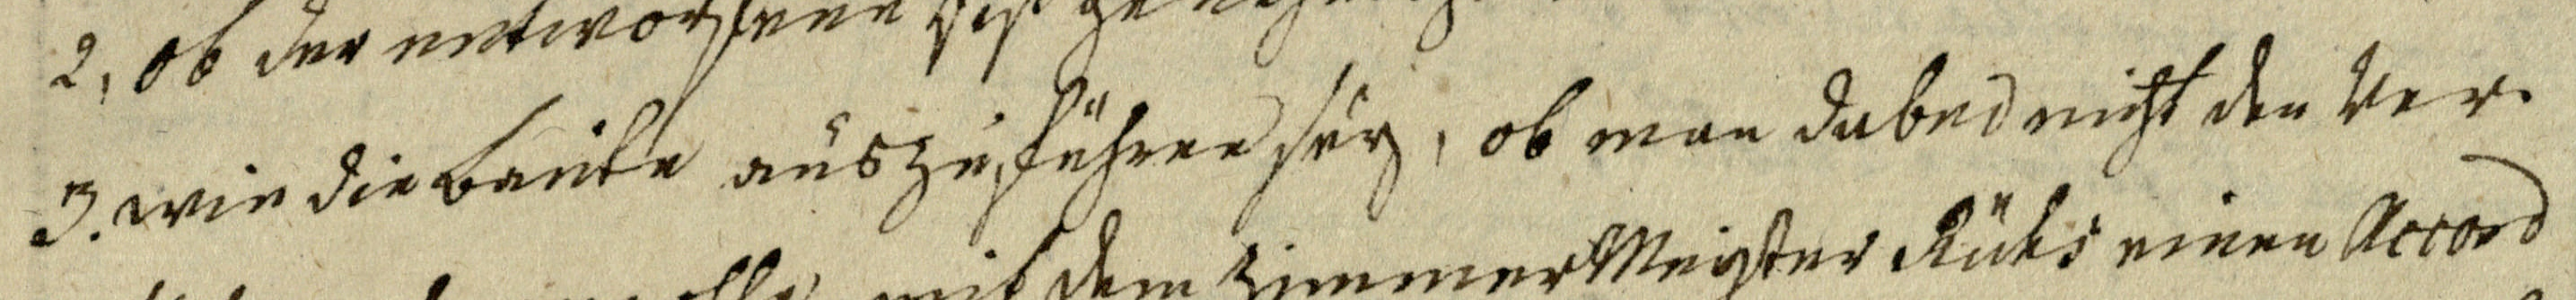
3. wie die Baute auszuführen seÿ, ob man dabei nicht den Ver¬
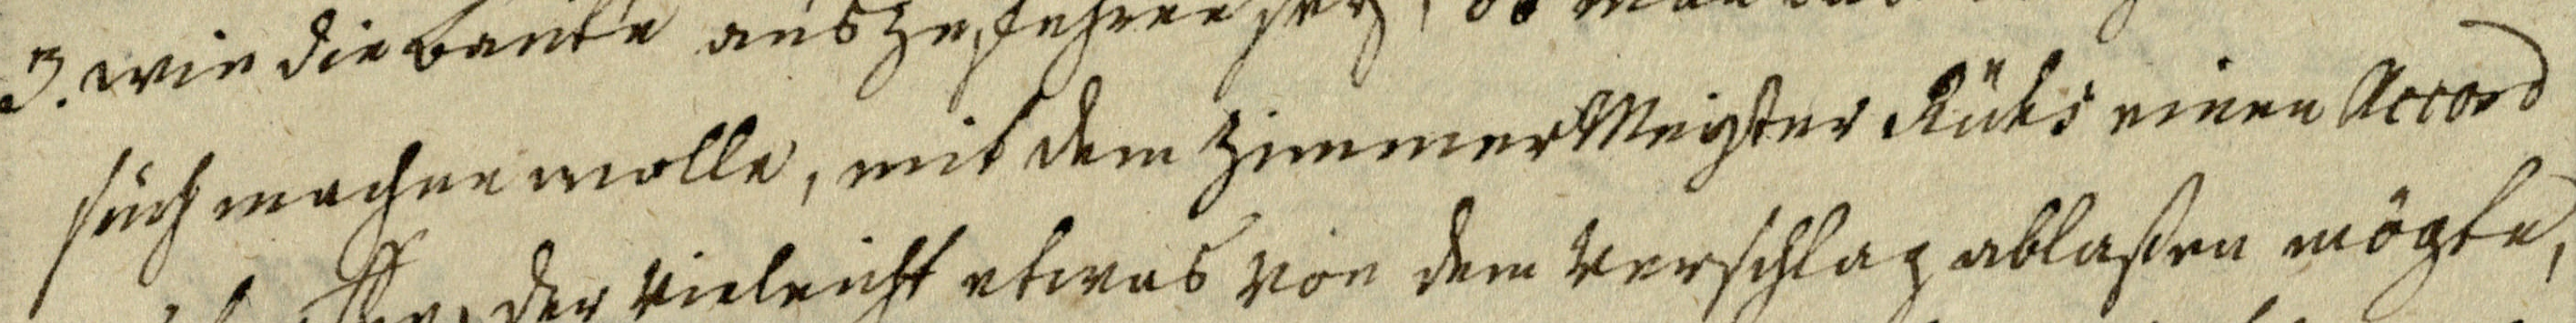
such machen wolle, mit dem ZimmerMeister Rühs einen Accord
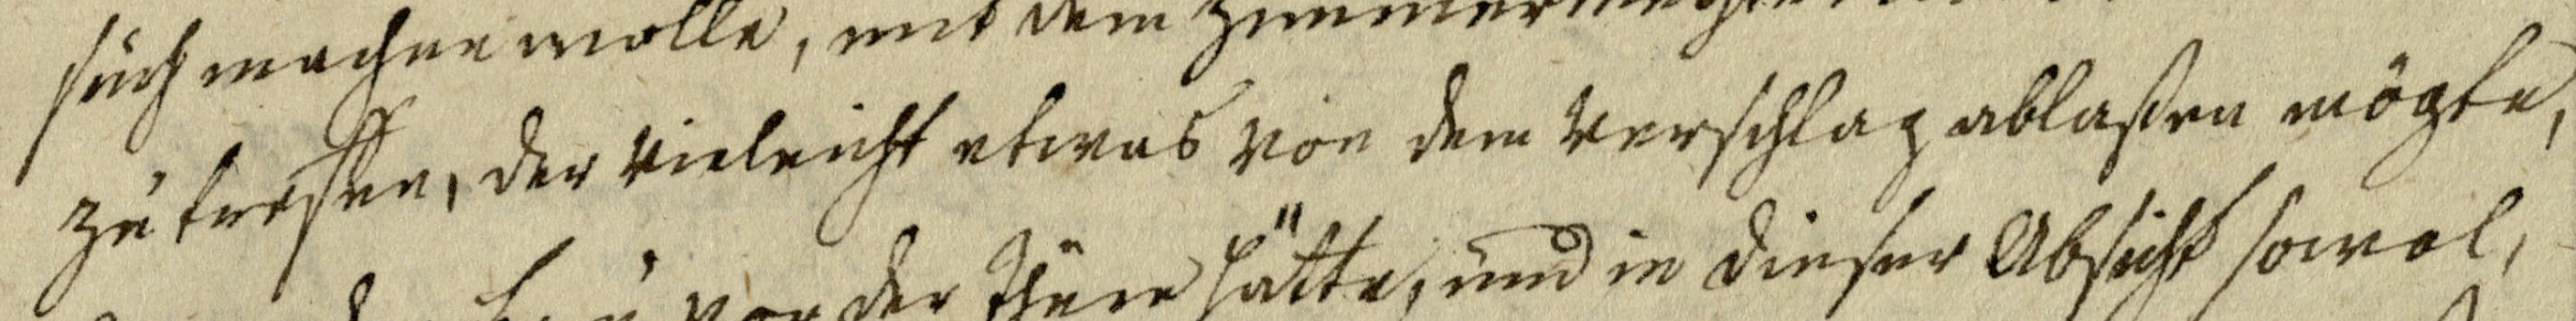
zu treffen, der vieleicht etwas von dem Verschlag ablaßen mögte,
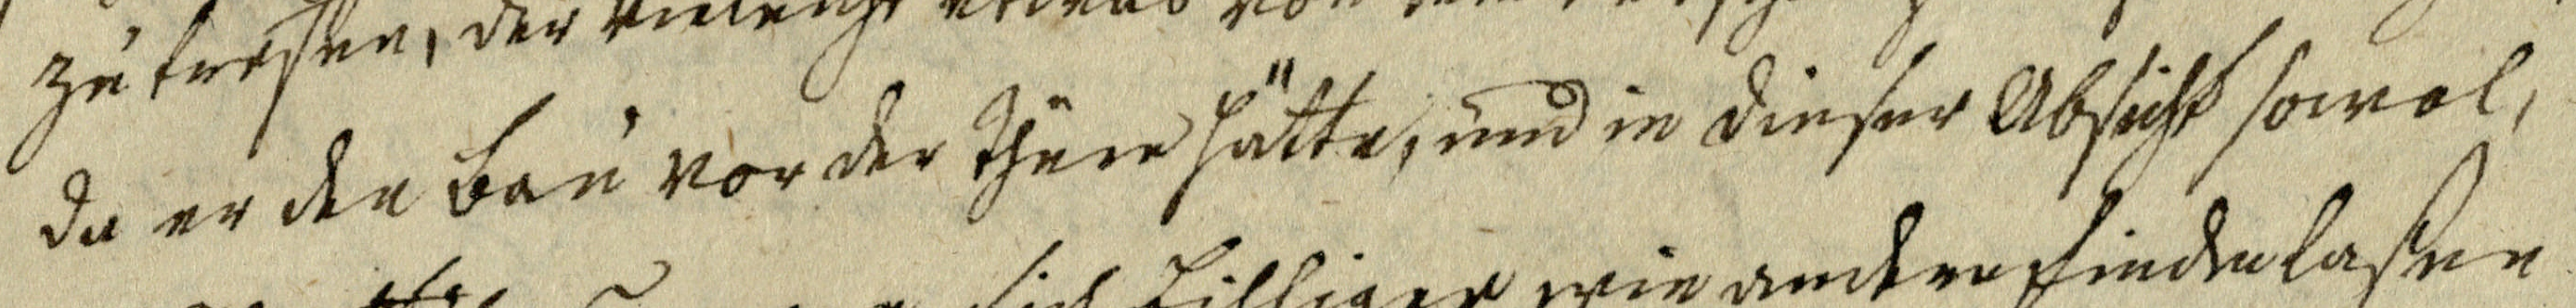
da er den Bau vor der Thüre hätte, und in dieser Absicht sowol,
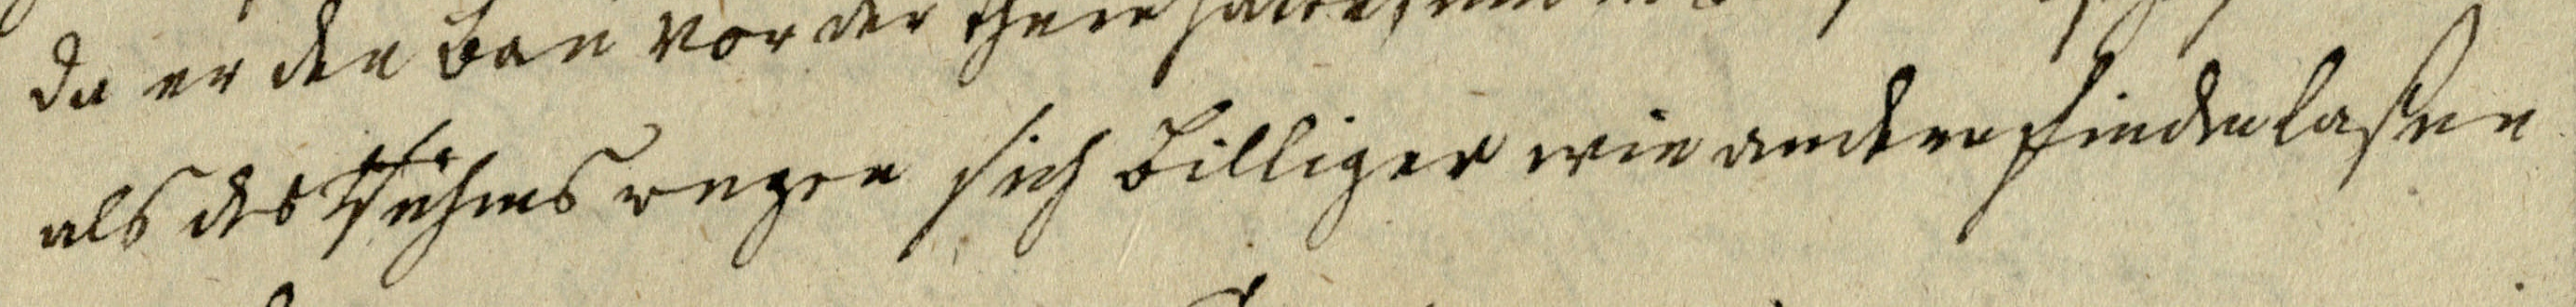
als des Ruhms wegen sich billiger wie andere finden laßen
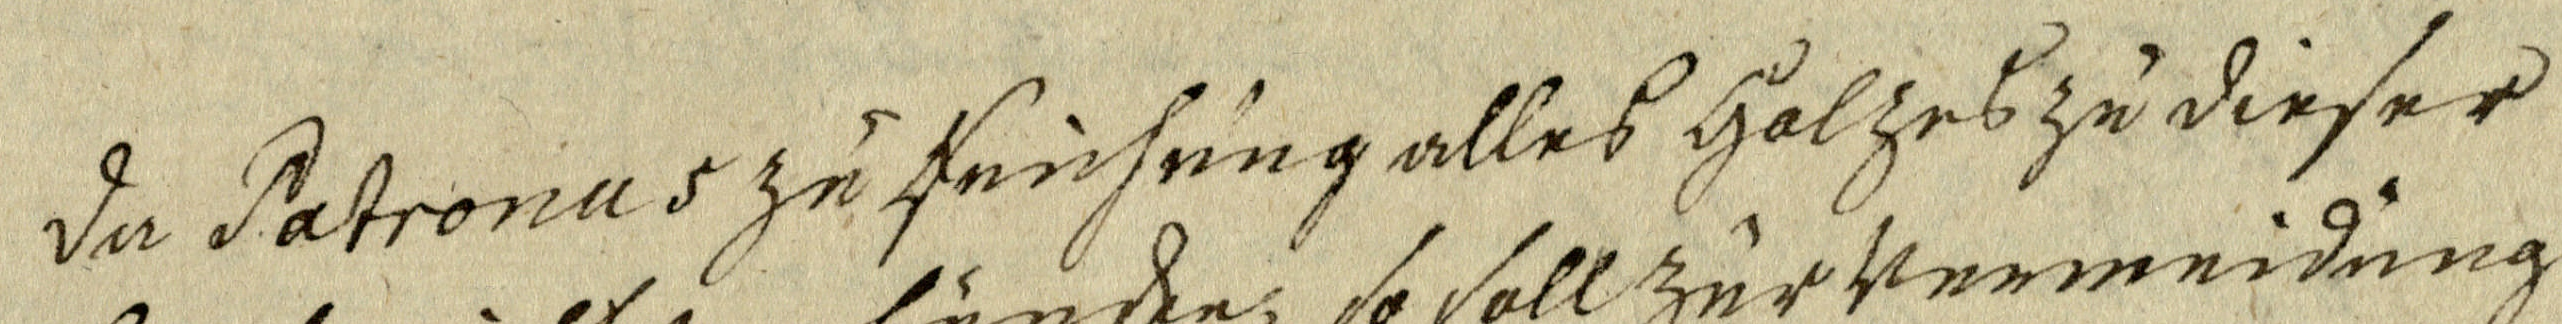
Da Patronus zu Reichung alles Holzes zu dieser
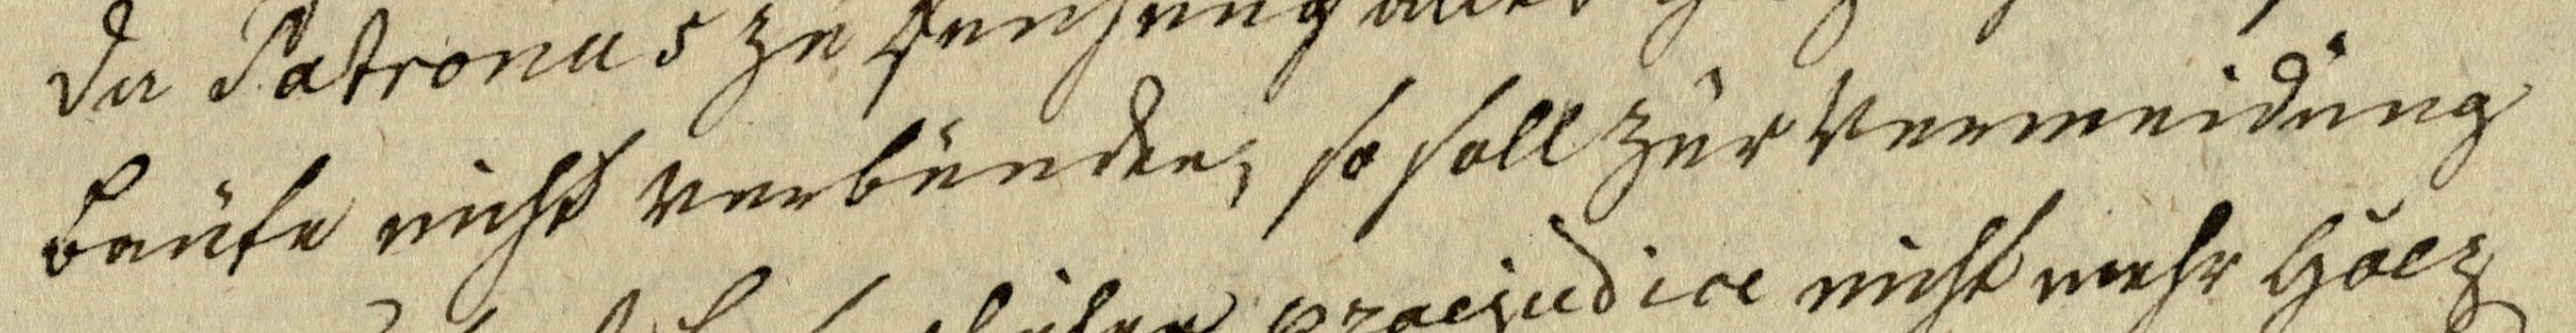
Baute nicht verbunden, so soll zur Vermeidung
